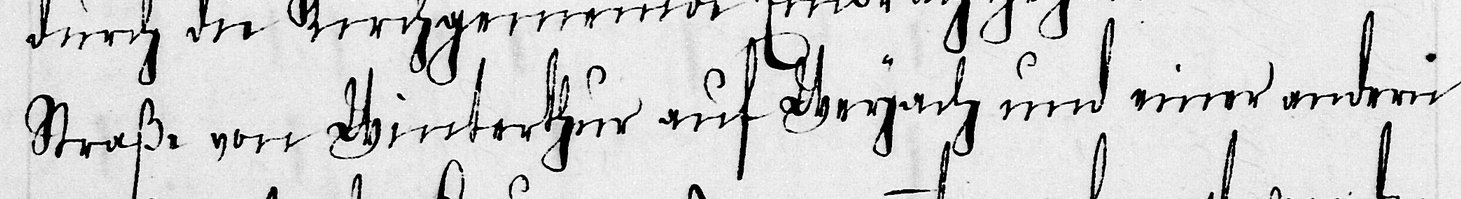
Straße von Winterthur auf Weyach und einer andern
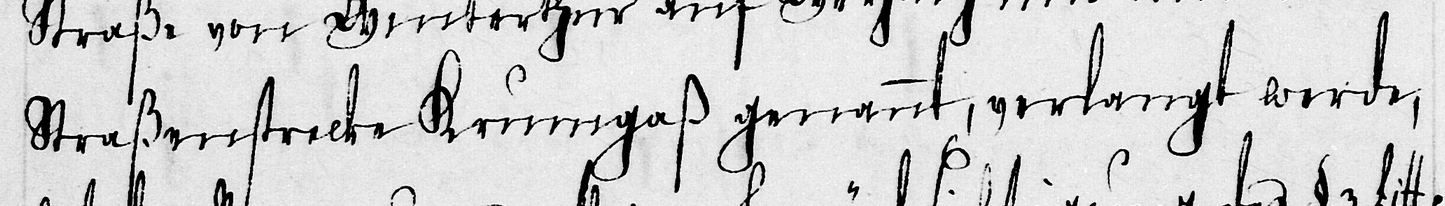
Straßenstrecke Krumgaß genannt, verlangt werde,
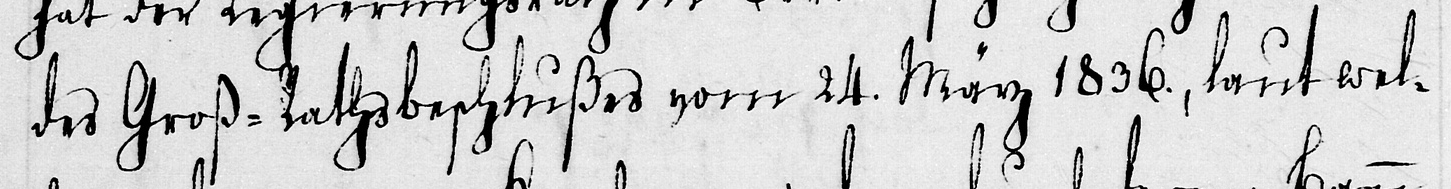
des Groß-Rathsbeschlußes vom 24. März 1836., laut wel¬
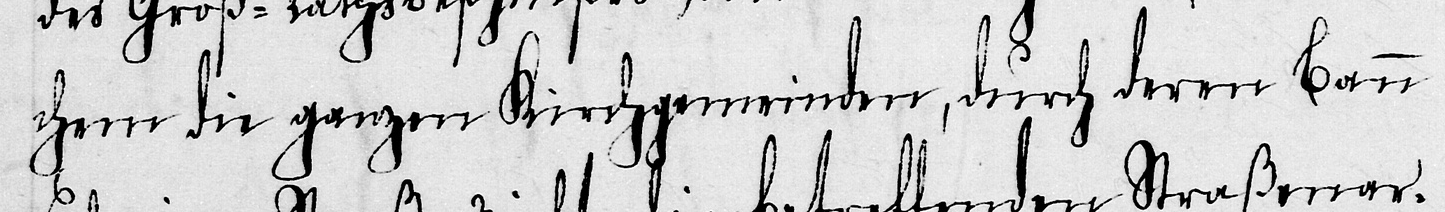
chem die ganzen Kirchgemeinden, durch deren Bann
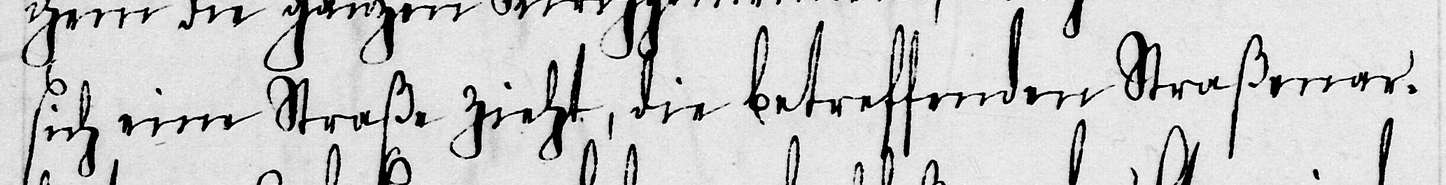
sich eine Straße zieht, die betreffenden Straßenar¬
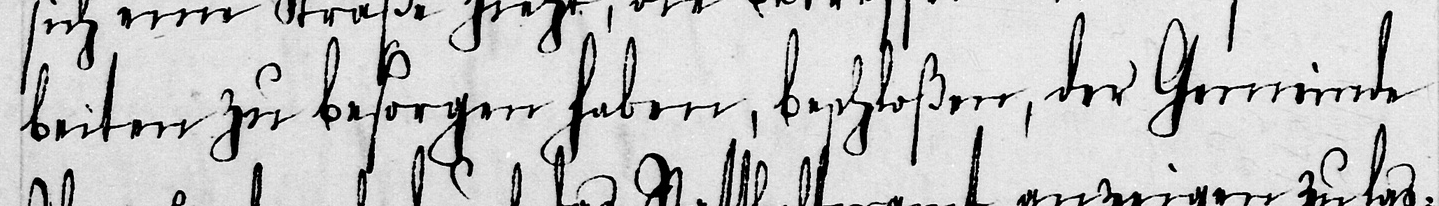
beiten zu besorgen haben, beschloßen, der Gemeinde
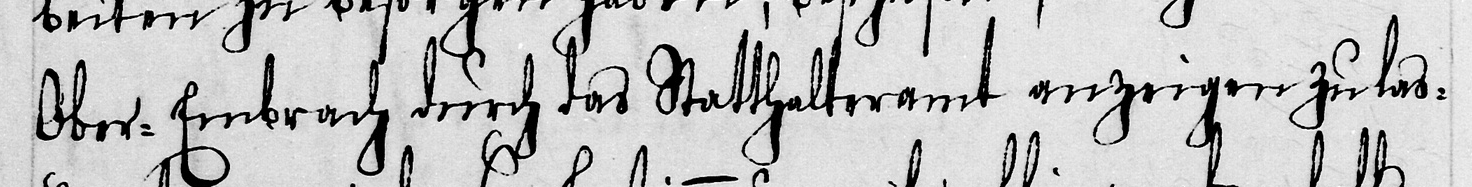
Ober-Embrach durch das Statthalteramt anzeigen zu laß¬
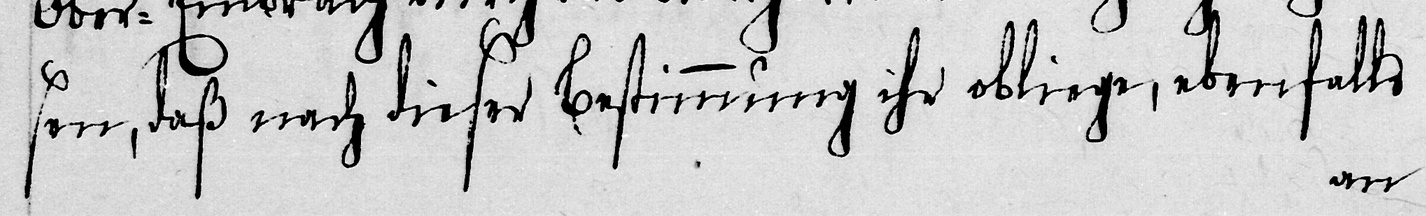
en, daß nach dieser Bestimmung ihr obliege, ebenfalls
